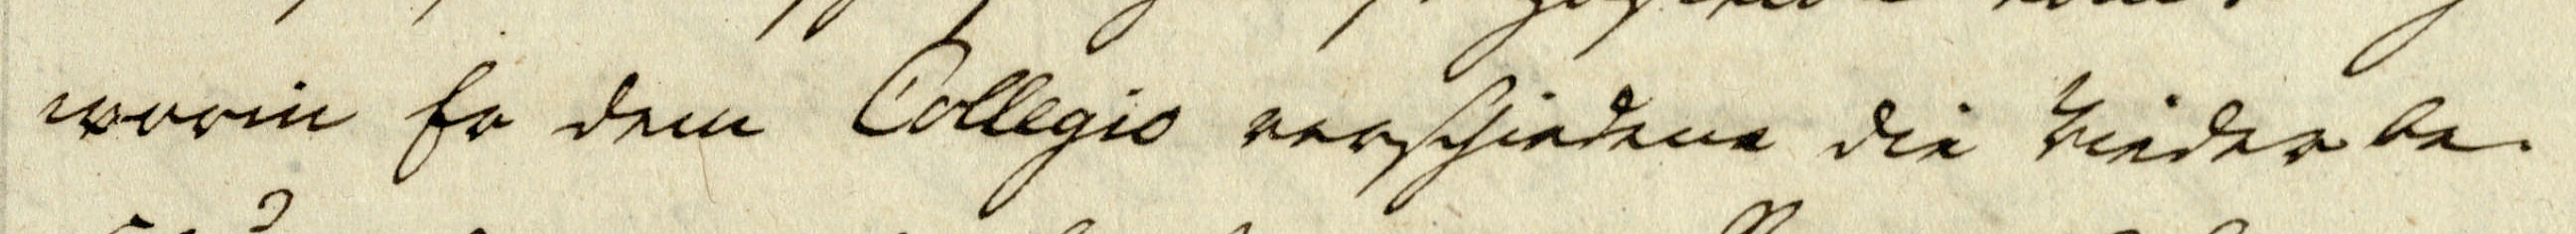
worin Er dem Collegio verschiedene die Wiederbe¬
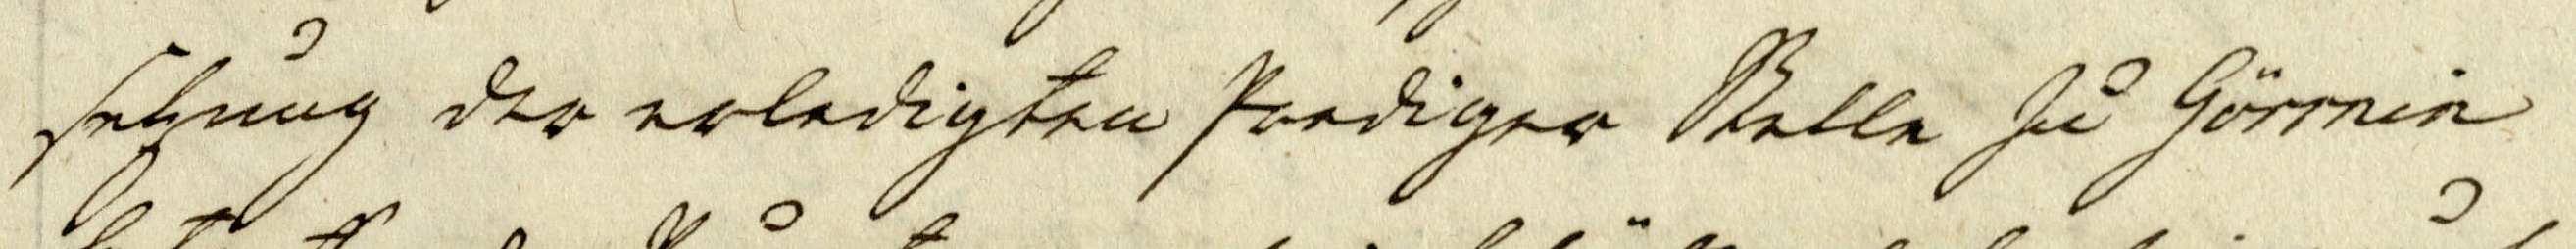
setzung der erledigten Prediger Stelle zu Görmin
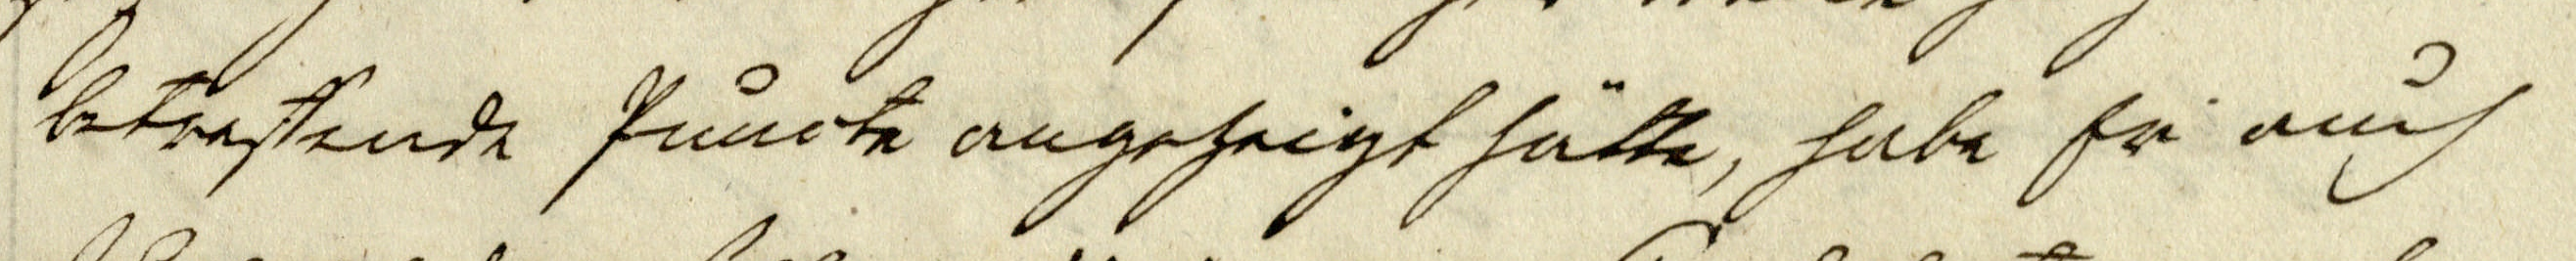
betreffende Puncte angezeigt hätte, habe Er auch
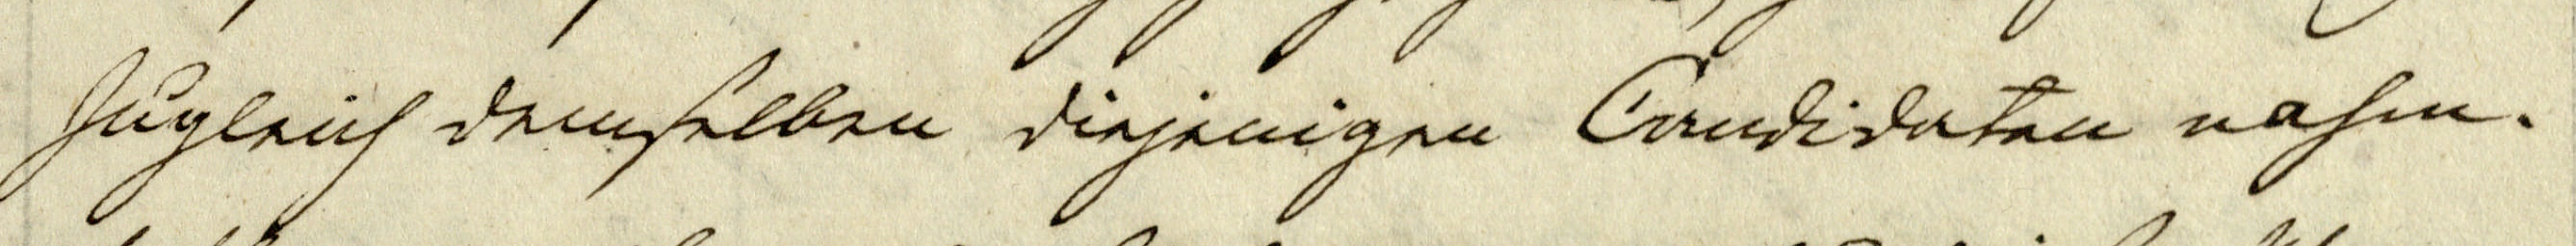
zugleich demselben diejenigen Candidaten nahm¬
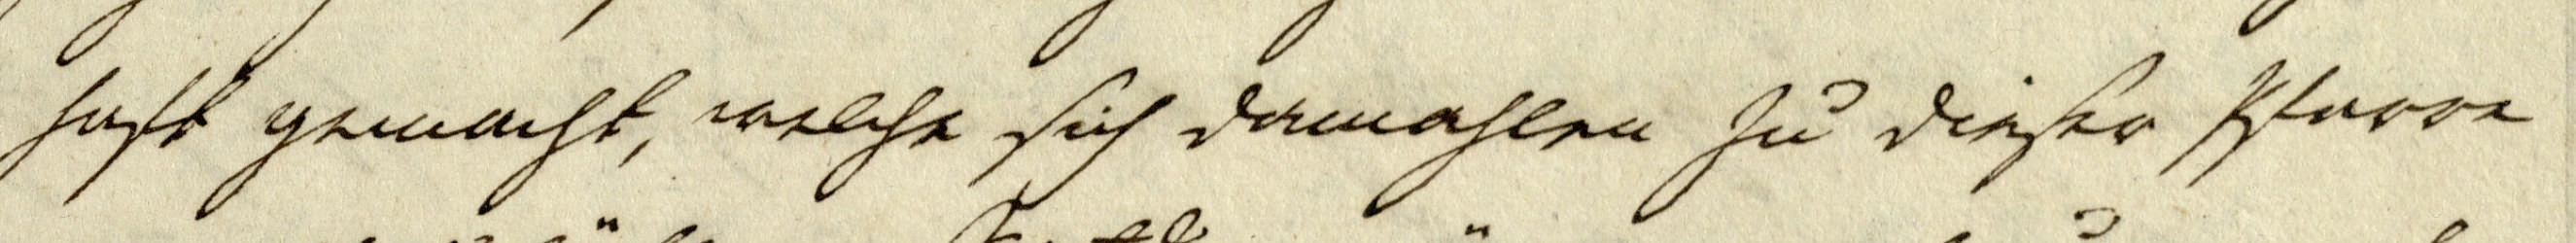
haft gemacht, welche sich damahlen zu dieser Pfarre
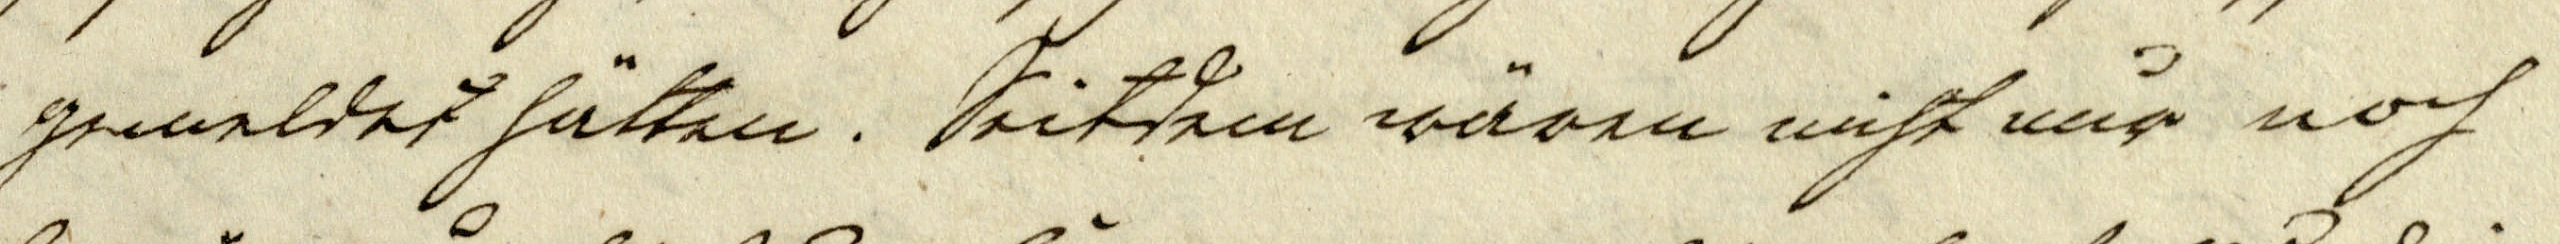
gemeldet hätten. Seitdem wären nicht nur noch
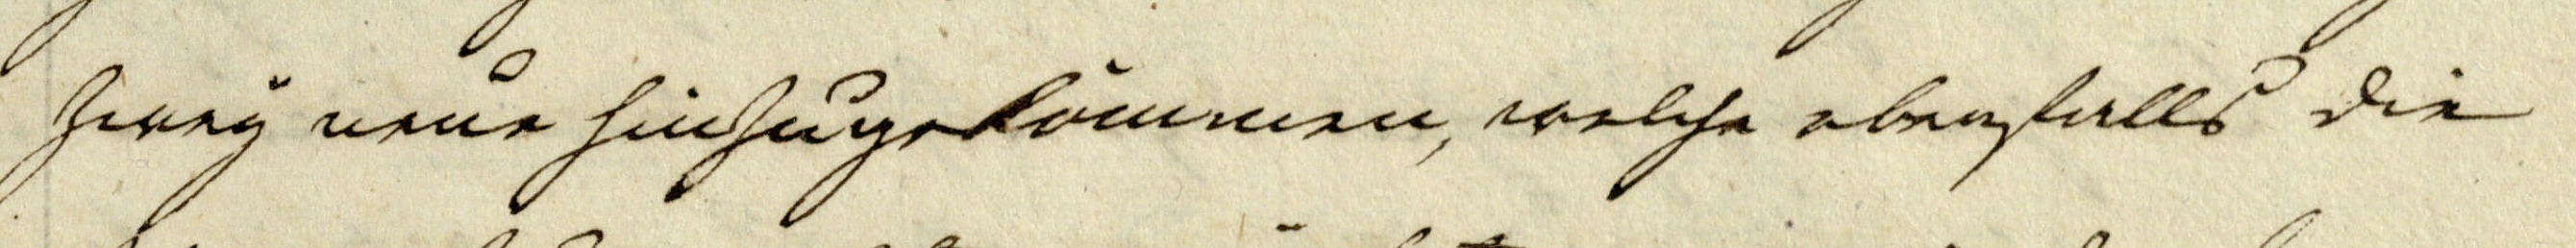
zweÿ neue hinzugekommen, welche ebenfalls die
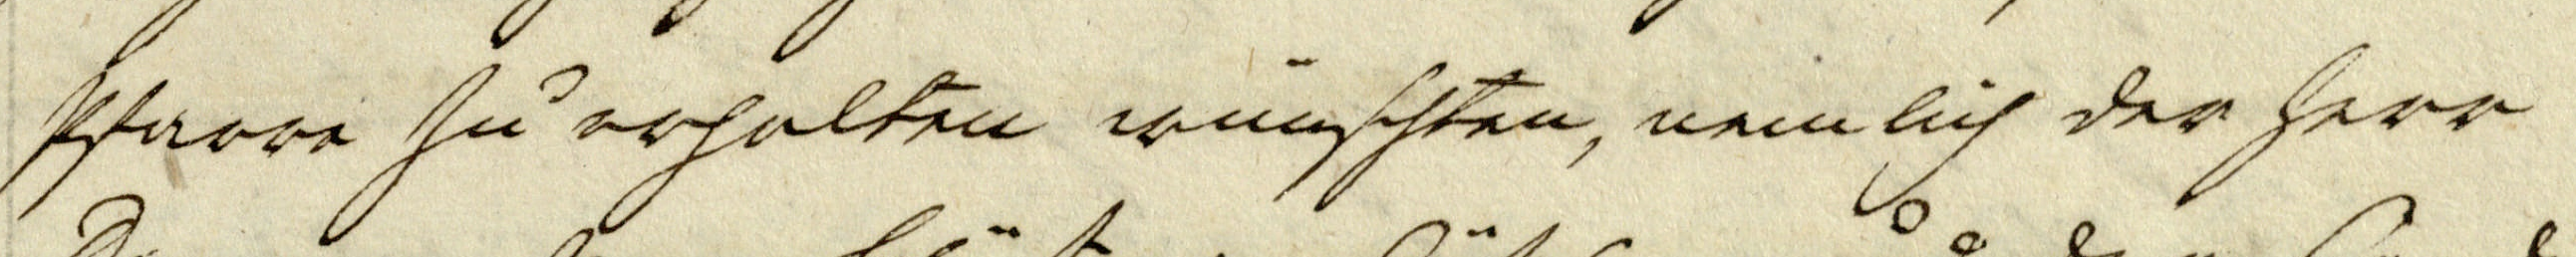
Pfarre zu erhalten wünschten, nemlich der Herr
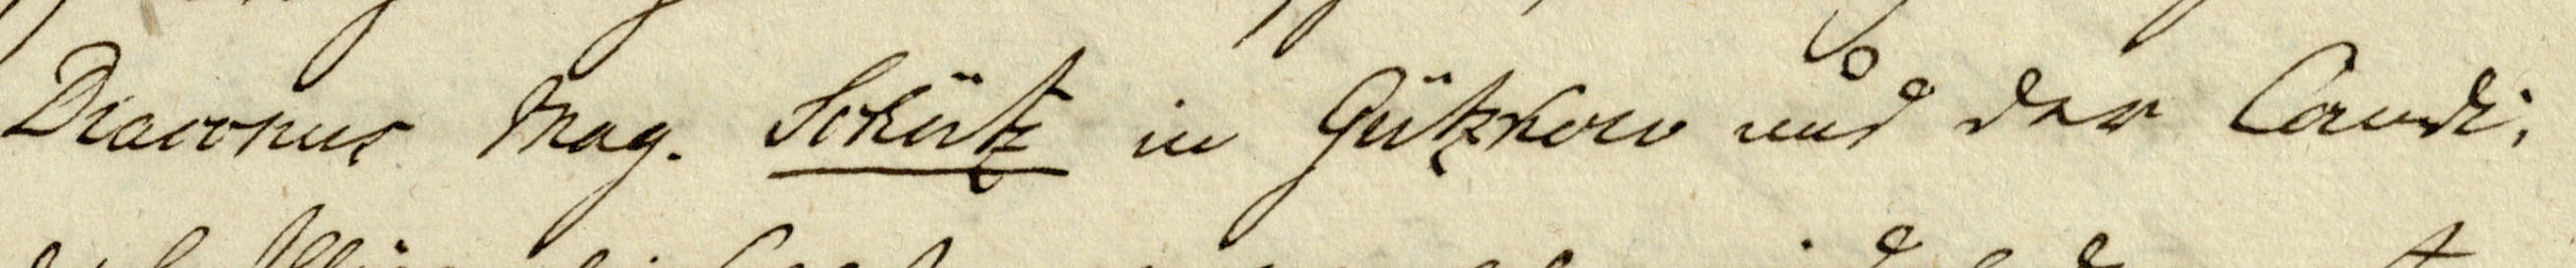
Diaconus Mag. Schütz in Gützkow und der Candi¬
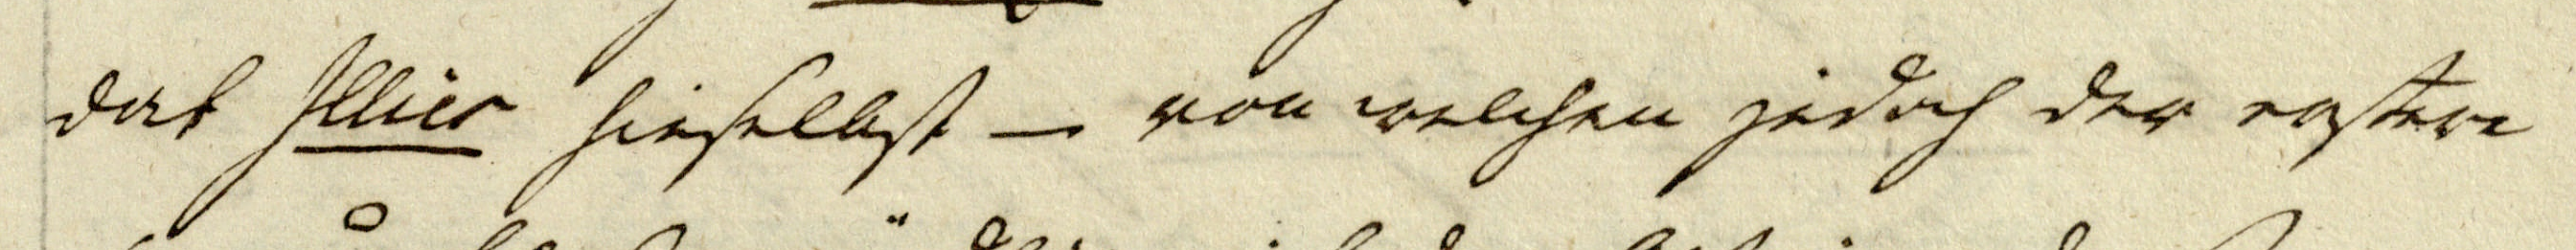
dat Illies hieselbst von welchen jedoch der erstere
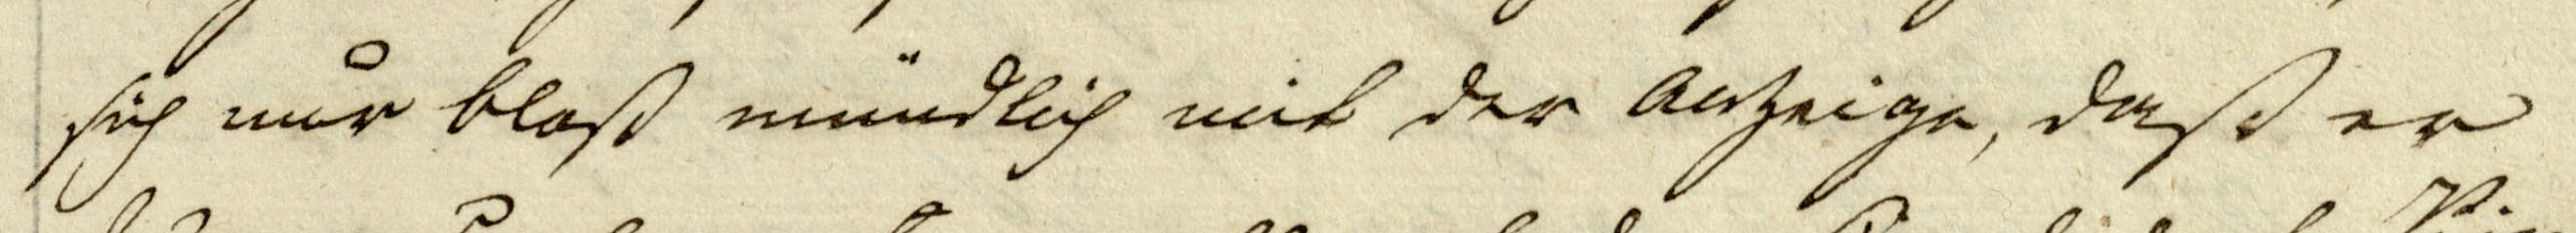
sich nur bloß mündlich mit der Anzeige, daß er
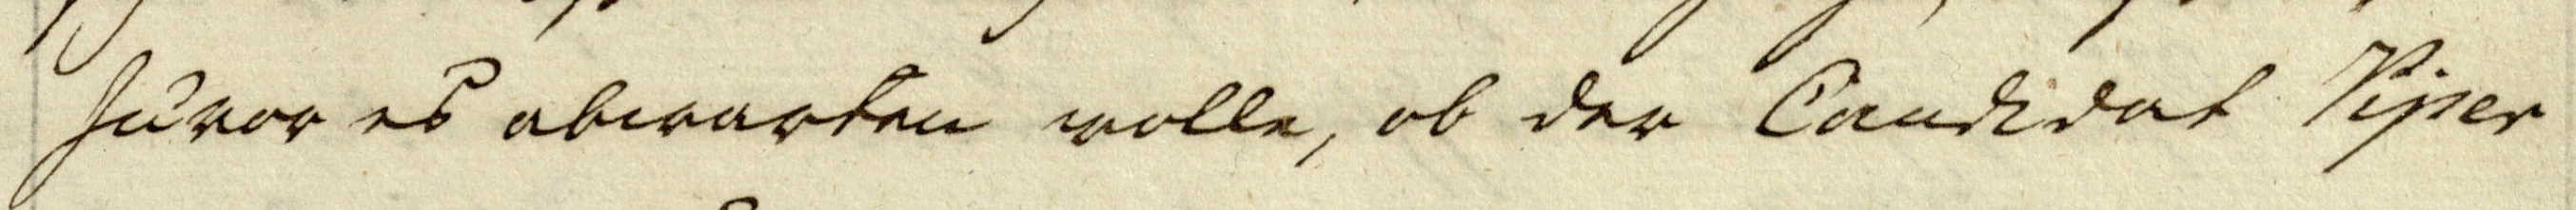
zuvor es abwarten wolle, ob der Candidat Piper
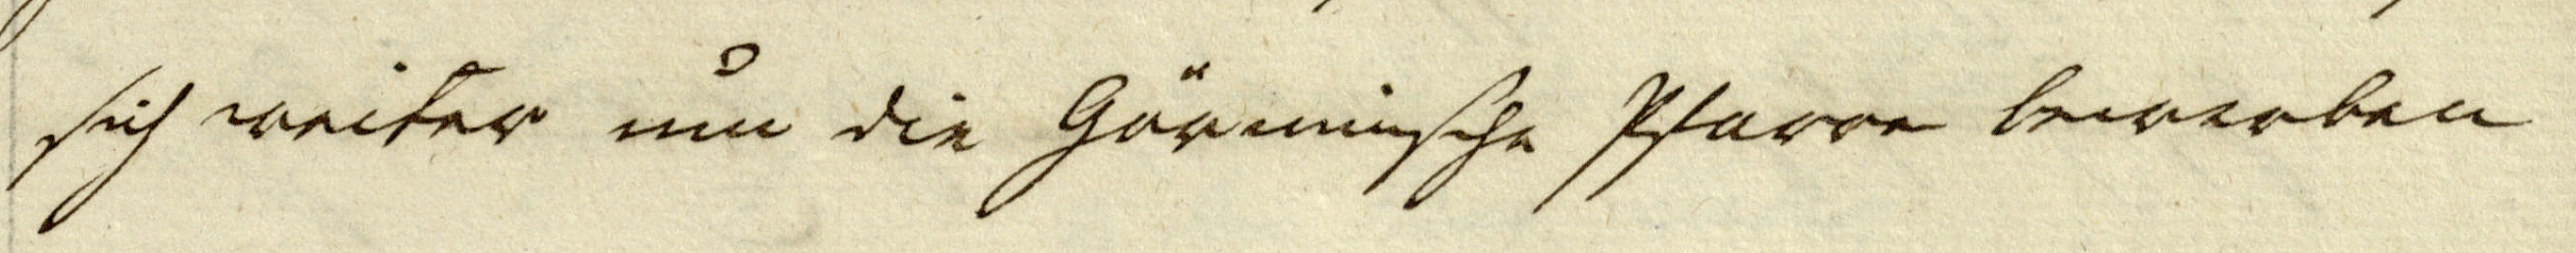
sich weiter um die Görminsche Pfarre bewerben
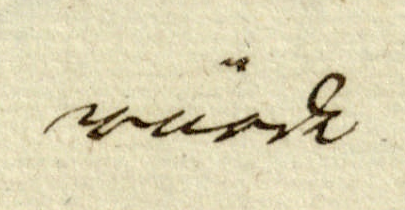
würde
